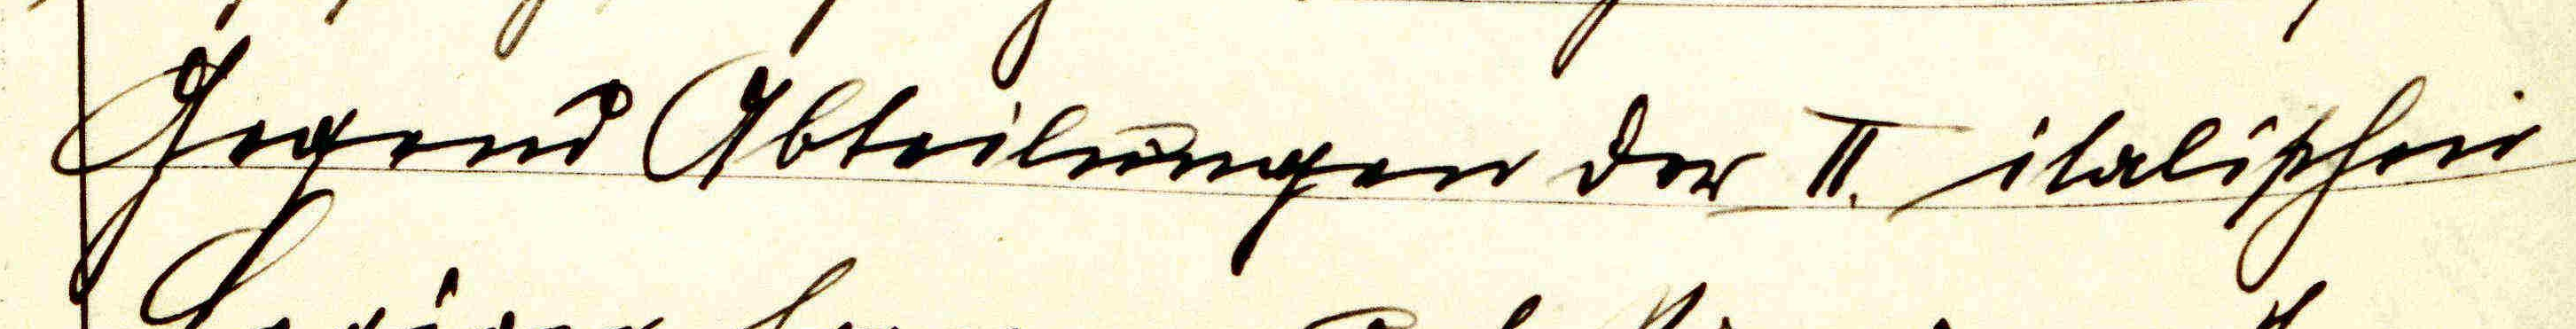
Gegend Abteilungen der II. italischen
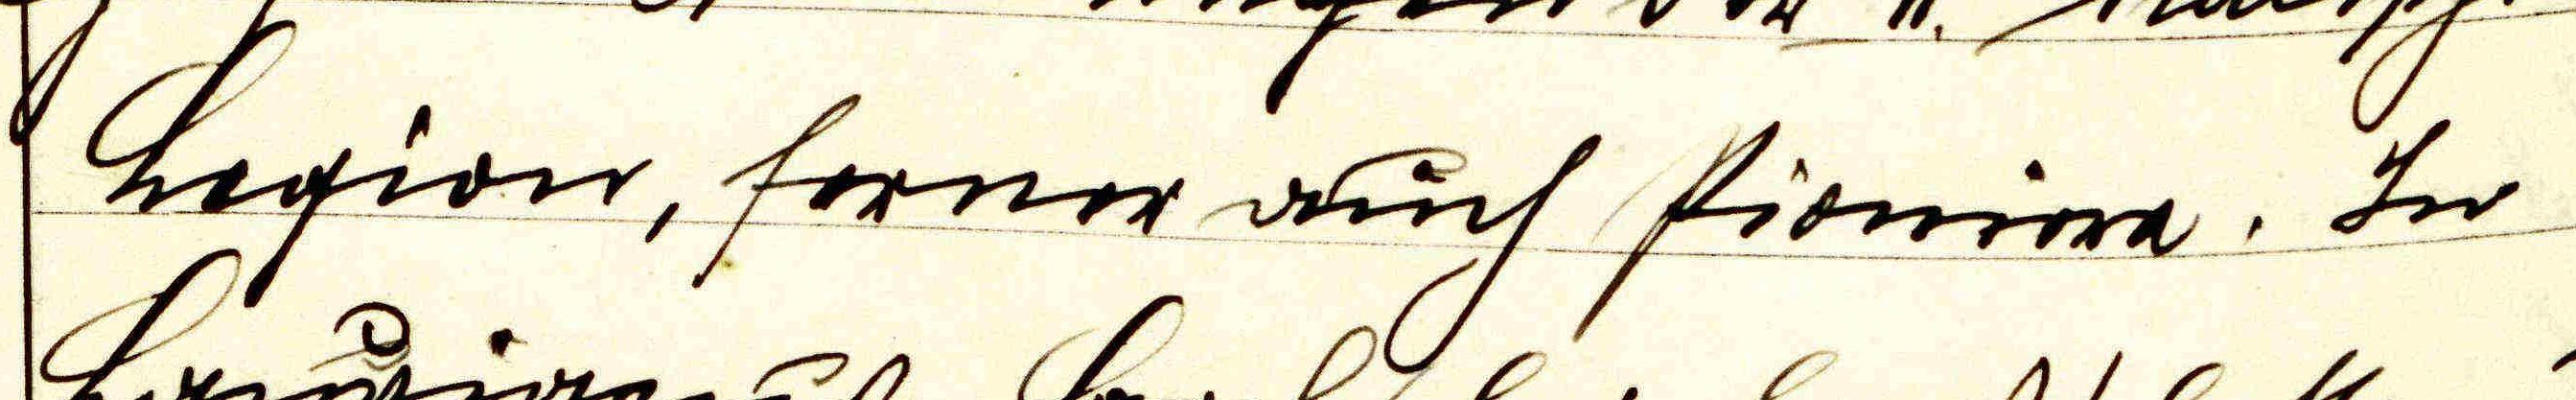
Legion, ferner auch Pioniere. In
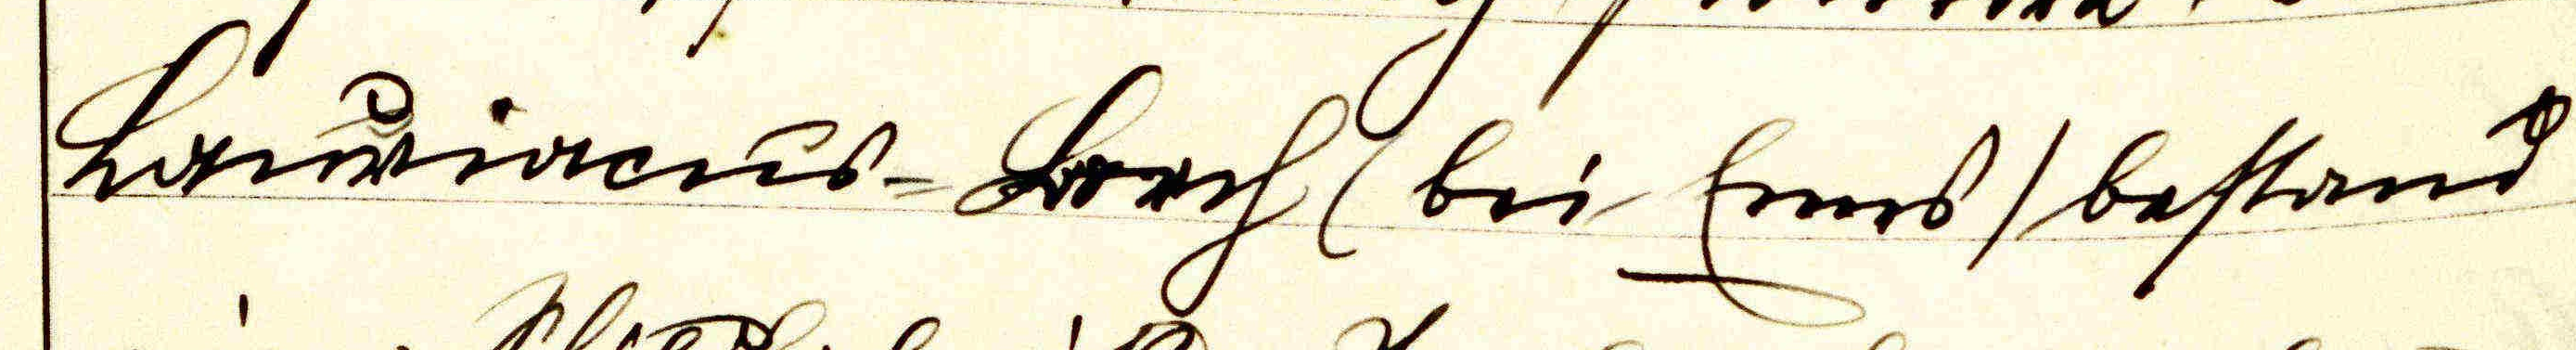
Lauriacus – Lorch (bei Enns) bestand
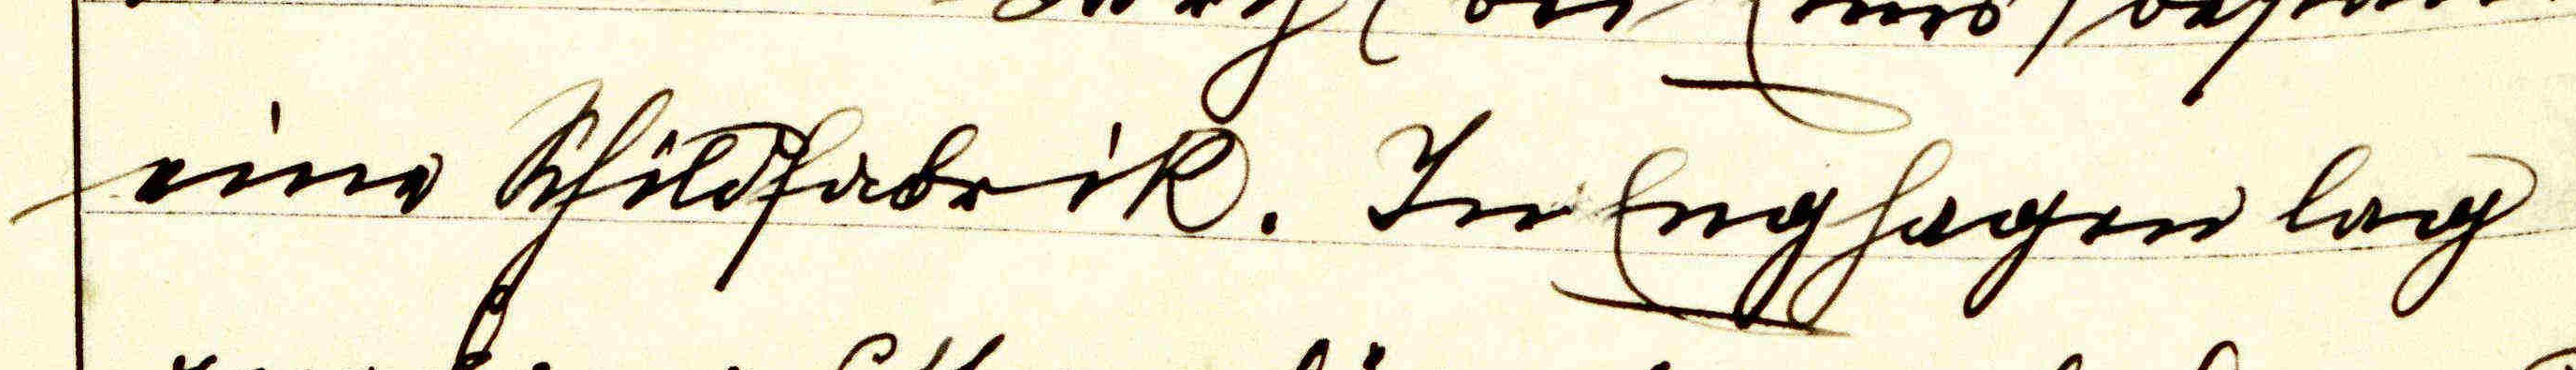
eine Schildfabrik. In Enghagen lag
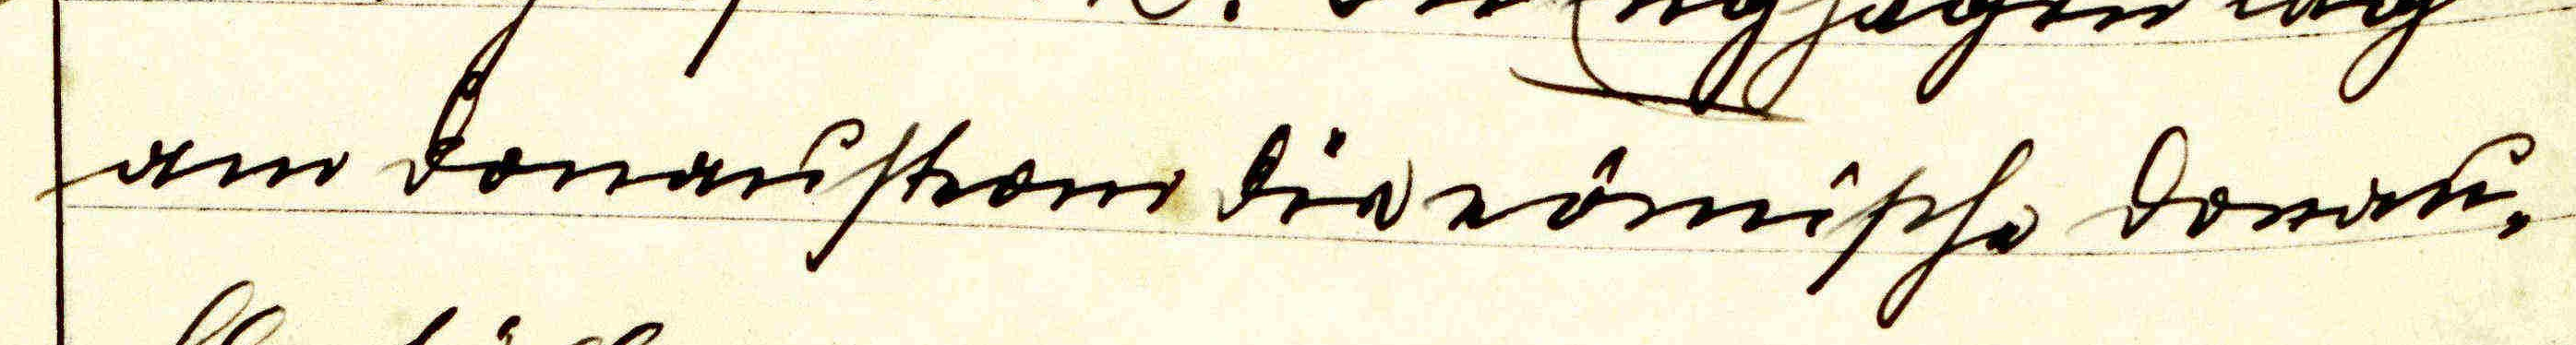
am Donaustrom die römische Donau-
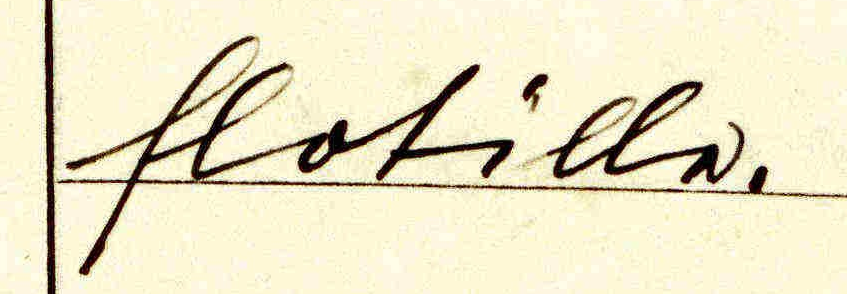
flotille.
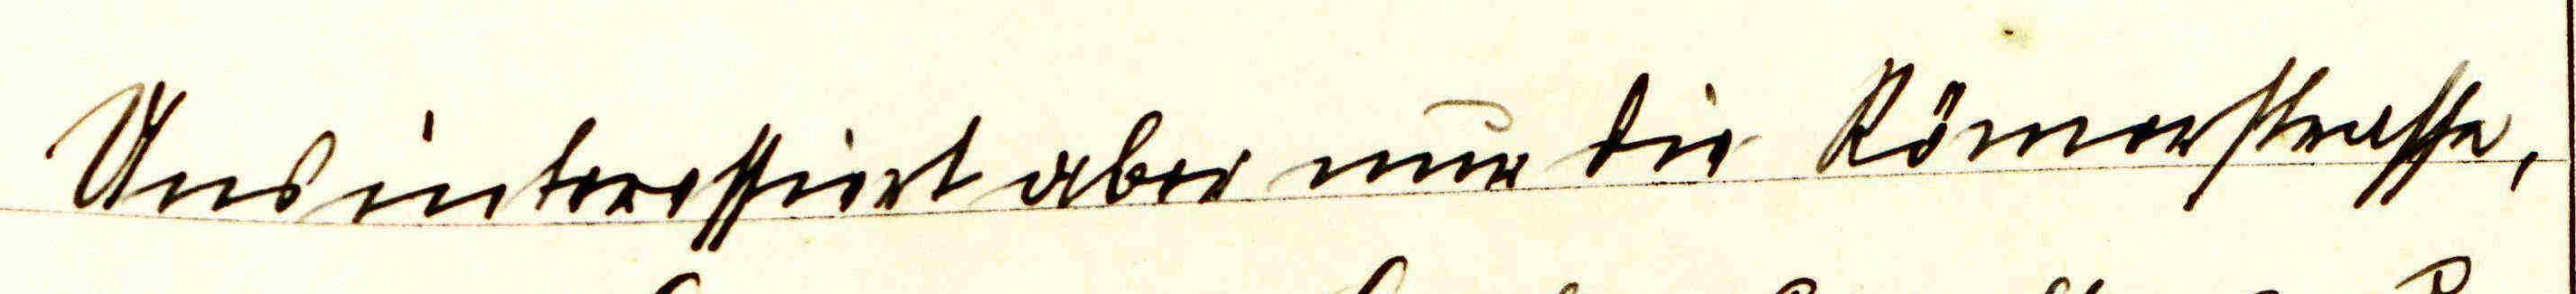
Uns interessiert aber nur die Römerstrasse,
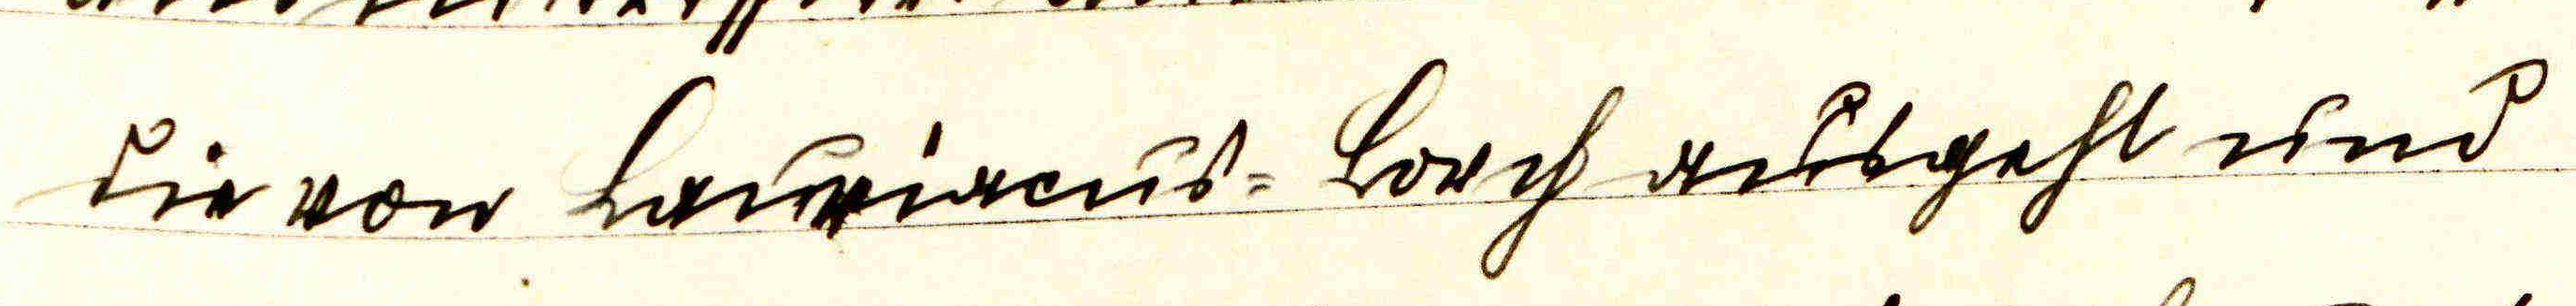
die von Lauriacus – Lorch ausgeht und
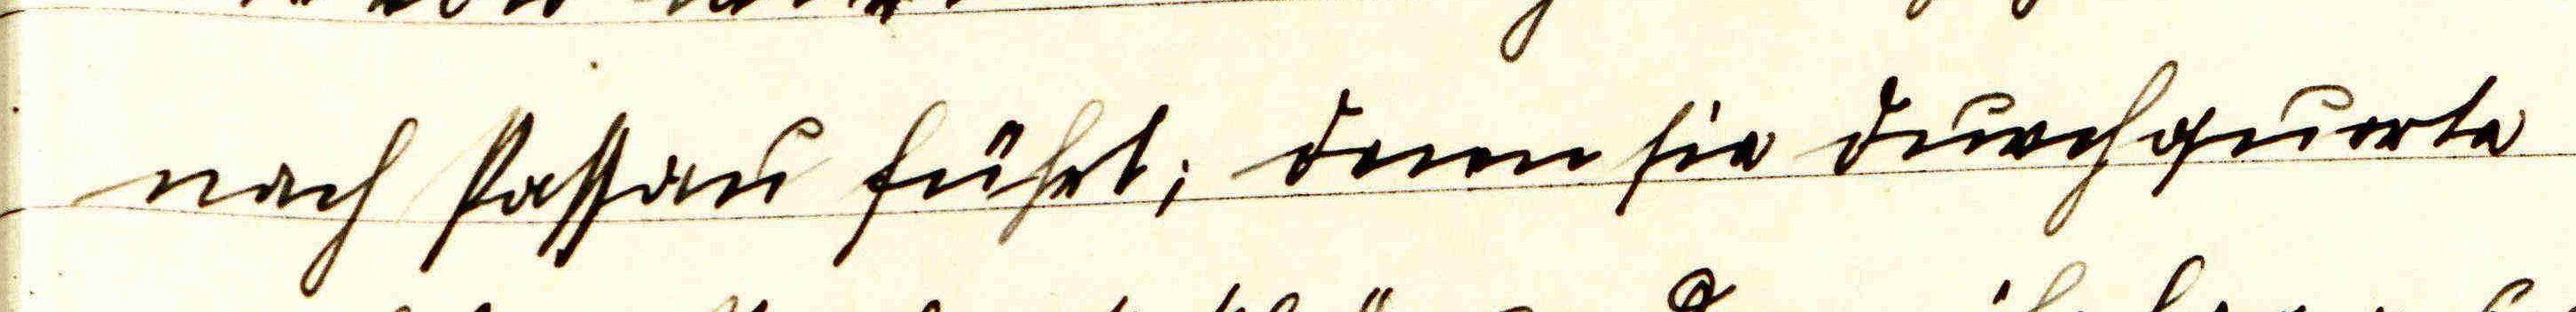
nach Passau führt; denn sie durchquerte
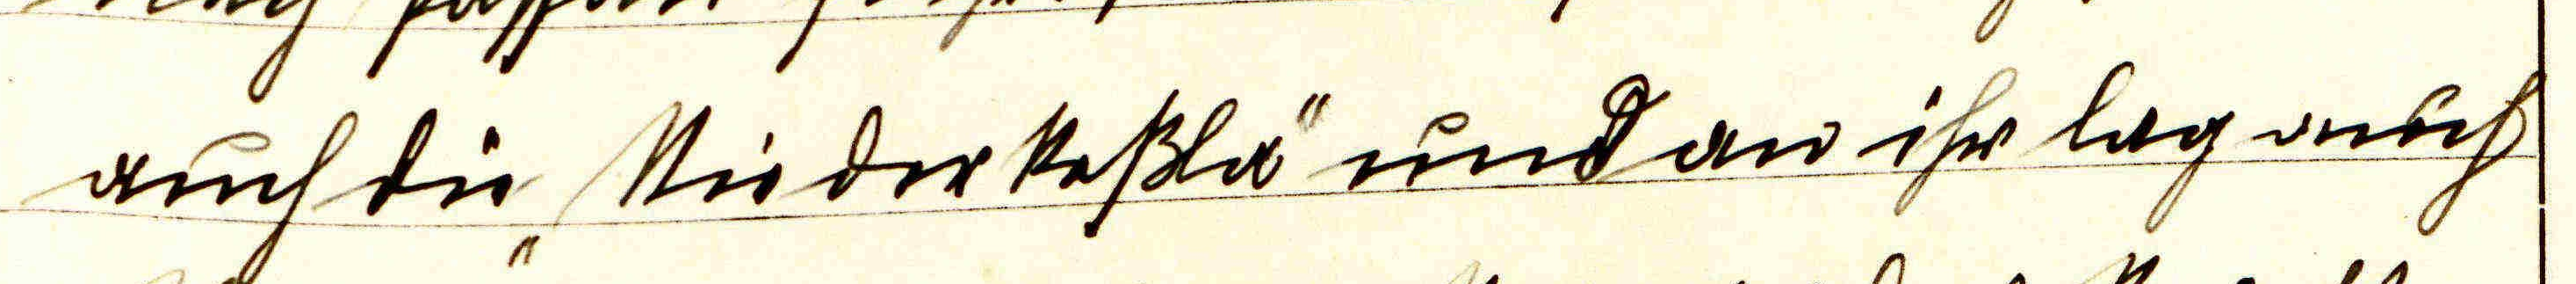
auch die „Niederkeßla“ und an ihr lag auch
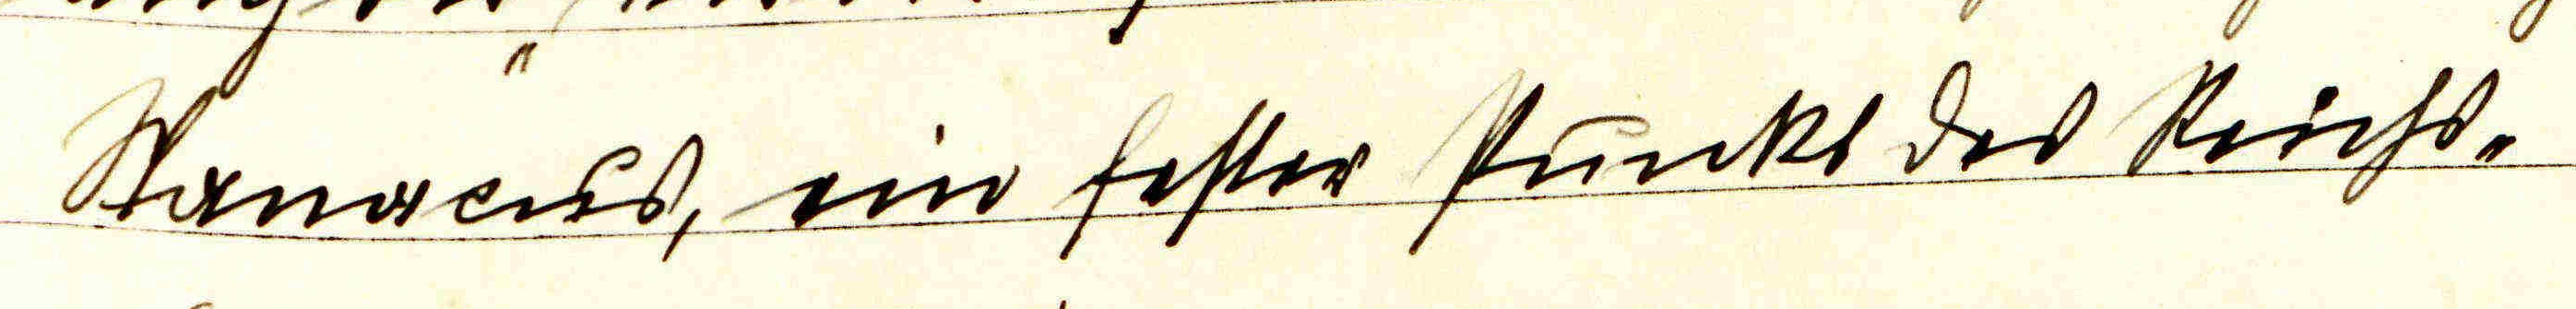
Stanacus, ein fester Punkt des Reichs-
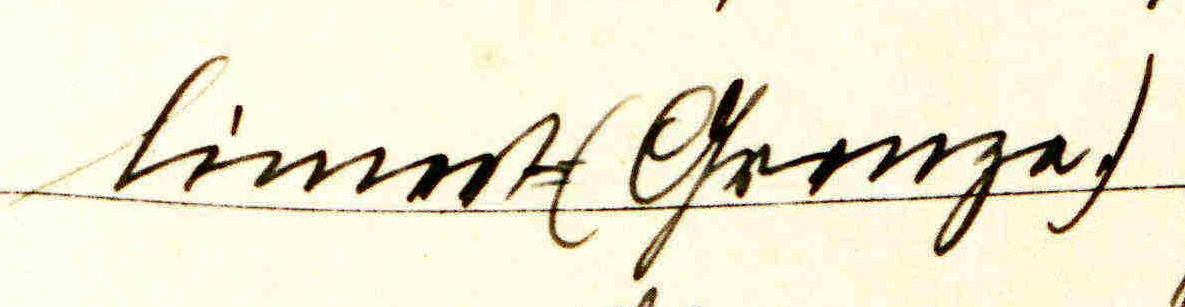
limes (Grenze).
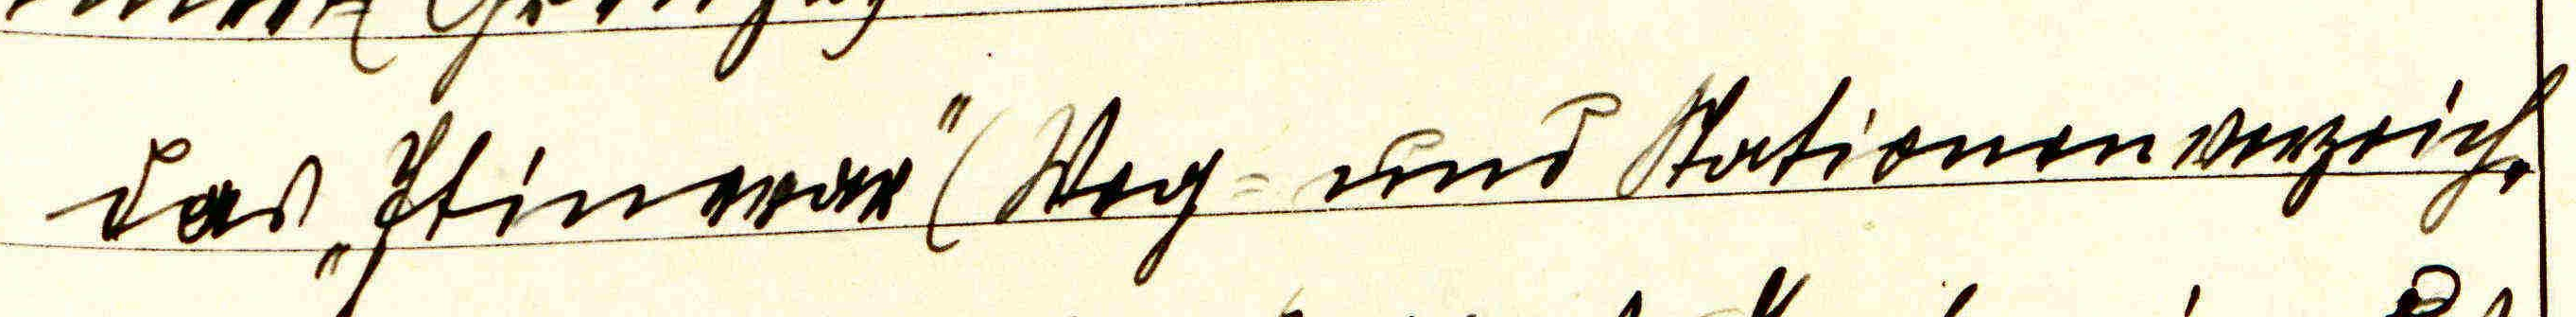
Das „Itinerar“ (Weg- und Stationenverzeich-
